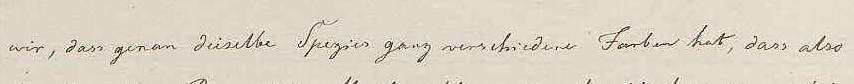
wir, dass genau dieselbe Spezies ganz verschiedene Farben hat, dass also
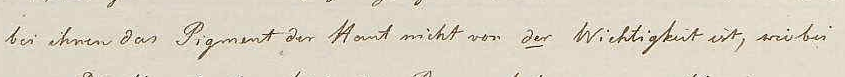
bei ihnen das Pigment der Haut nicht von der Wichtigkeit ist, wie bei
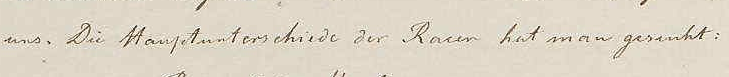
uns. Die Hauptunterschiede der Racen hat man gesucht:
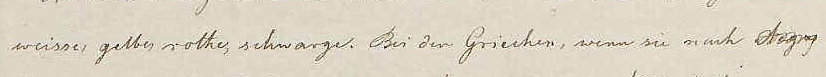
weisse, gelbe, rothe, schwarze. Bei den Griechen, wenn sie nach Aegy
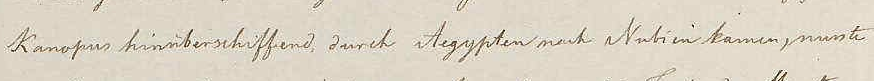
Kanopus hinüberschiffend durch Aegypten nach Nubien kamen, muste
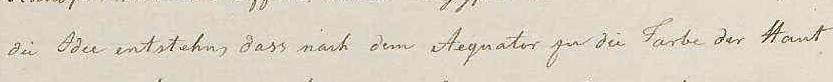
die Idee entstehn, dass nach dem Aequator zu die Farbe der Haut
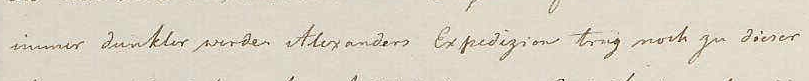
immer dunkler werde. Alexanders Expedizion trug noch zu dieser
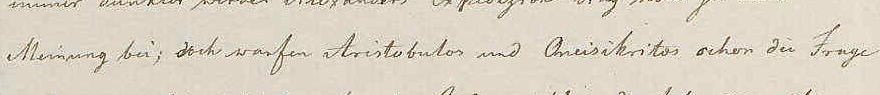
Meinung bei; doch warfen Aristobulos und Oneisikritos schon die Frage
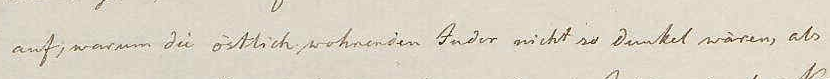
auf, warum die östlich wohnenden Inder nicht so dunkel wären, als
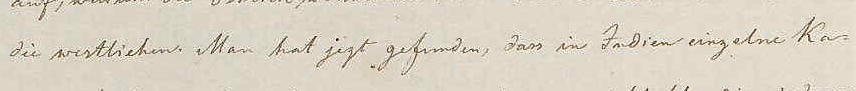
die westlichen. Man hat jezt gefunden, dass in Indien einzelne Ka-
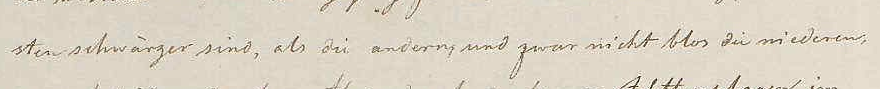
sten schwärzer sind, als die andern, und zwar nicht blos die niederen,
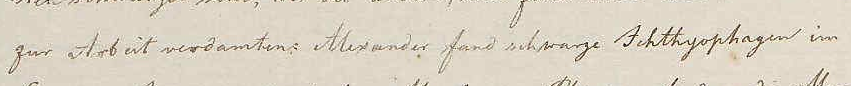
zur Arbeit verdamten: Alexander fand schwarze Ichthyophagen im
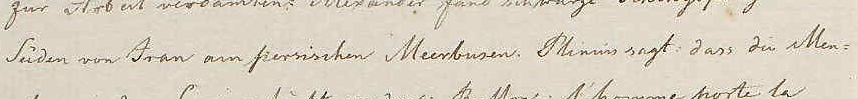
Süden von Iran am persischen Meerbusen. Plinius sagt: dass die Men-
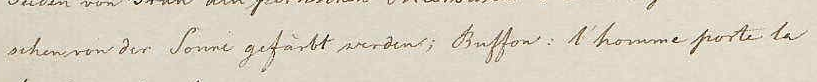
schen von der Sonne gefärbt werden; Buffon: l'homme porte la
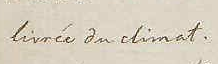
livrée du climat.
